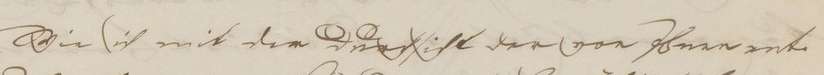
Wie ich mit der Durchsicht der von Ihnen ent-
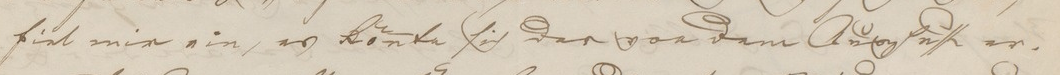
fiel mir ein, es könnte sich der von dem Ausschusse er-
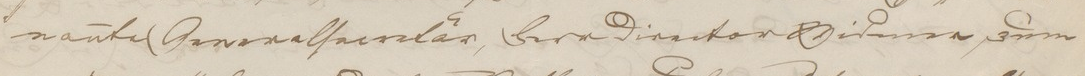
nannte Generalsecretär, Herr Director Widmer, zum
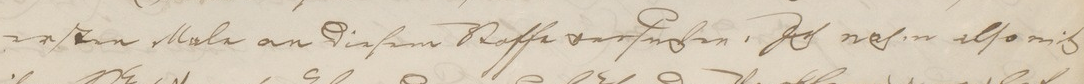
ersten Male an diesem Stoffe versuchen. Ich nahm also mit
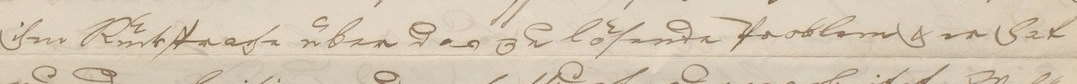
ihm Rücksprache über das zu lösende Problem & er hat
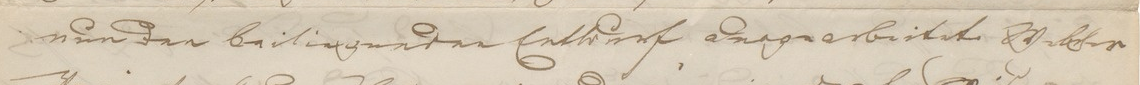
nun den beiliegenden Entwurf ausgearbeitet. Welches
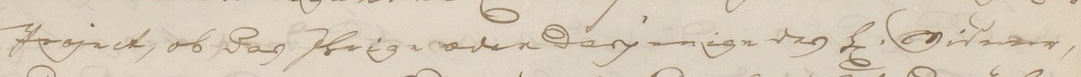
Project, ob das Ihrige oder dasjenige des Hrn Widmer,
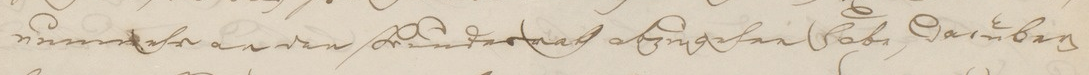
nunmehr an den Bundesrath abzugehen habe, darüber
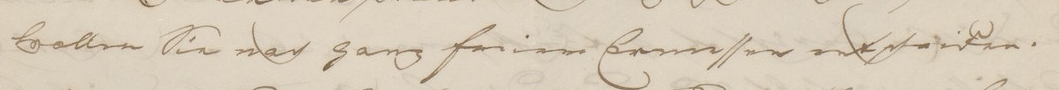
wollen Sie nach ganz freiem Ermessen entscheiden.
